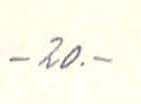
20.
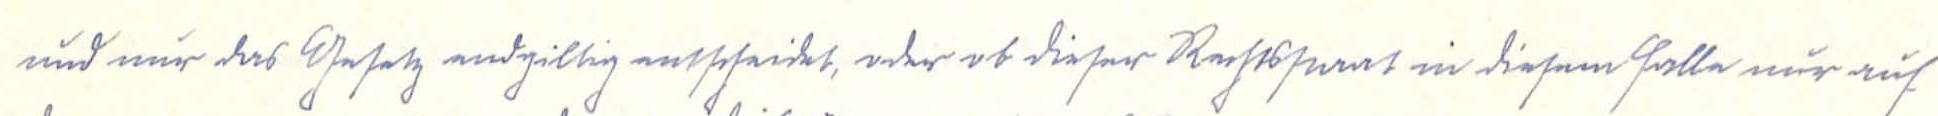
und nur das Gesetz endgültig entscheidet, oder ob dieser Rechtsstaat in diesem Falle nur auf
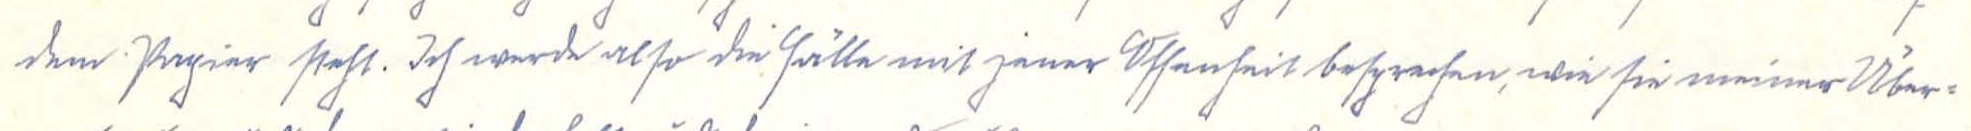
dem Papier steht. Ich werde also die Fälle mit jener Offenheit besprechen, wie sie meiner Über-
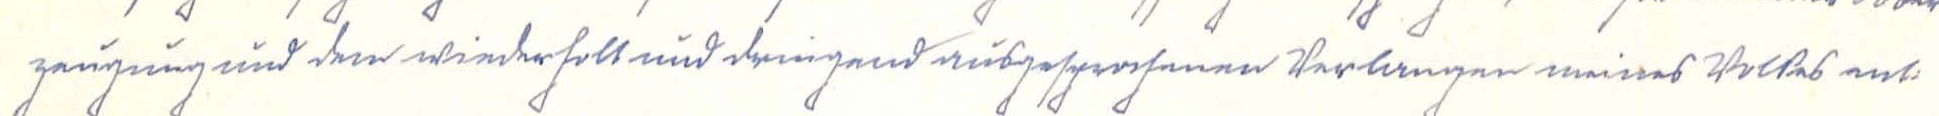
zeugung und den wiederholt und dringend ausgesprochenen Verlangen meines Volkes ent-
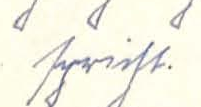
spricht.
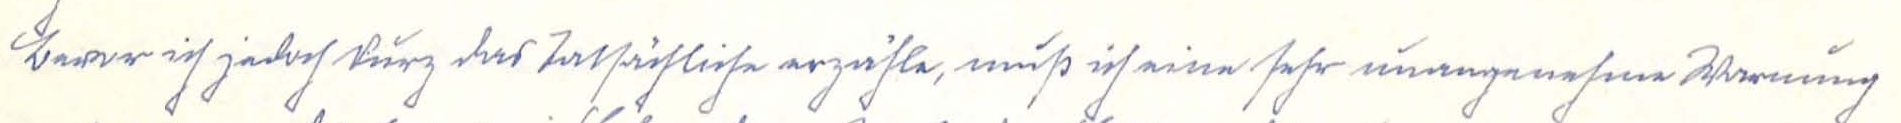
Bevor ich jedoch kurz das Tatsächliche erzähle, muß ich eine sehr unangenehme Warnung
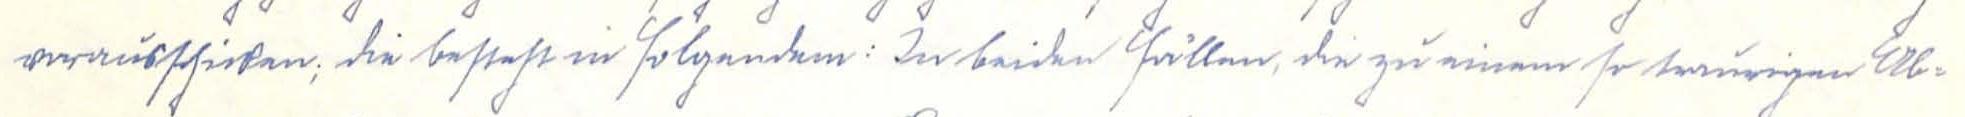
vorausschicken, die besteht in Folgendem: In beiden Fällen, die zu einem so traurigen Ab-
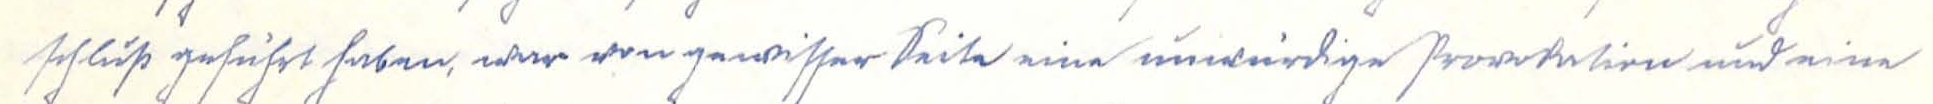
schluss geführt haben, war von gewisser Seite eine unwürdige Provokation und eine
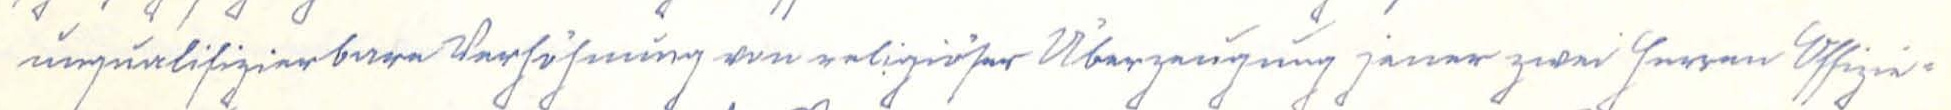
unqualifizierbare Verhöhnung von religiöser Überzeugung jener zwei Herren Offizie-
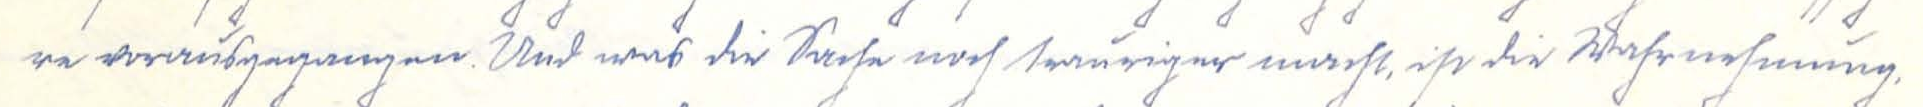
re vorausgegangen. Und was die Sache noch trauriger macht, ist die Wahrnehmung,
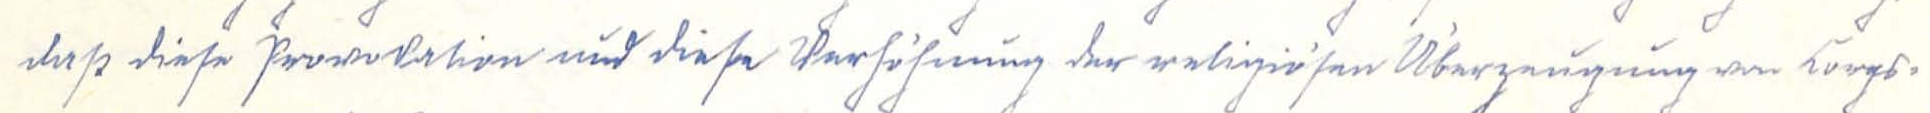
dass diese Provokation und diese Verhöhnung der religiösen Überzeugung von Corps-
